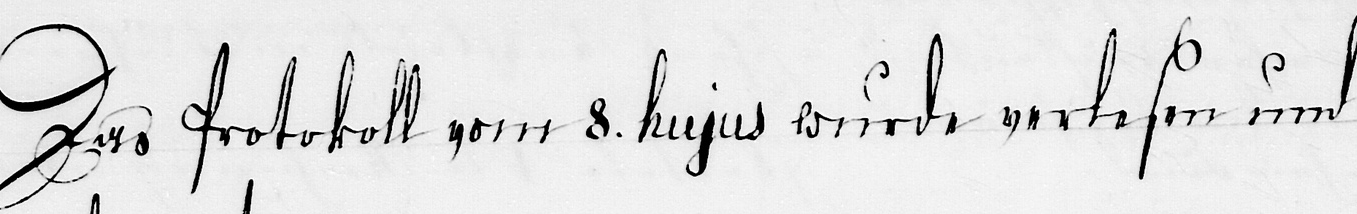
Das Protokoll vom 8. hujus wurde verlesen und
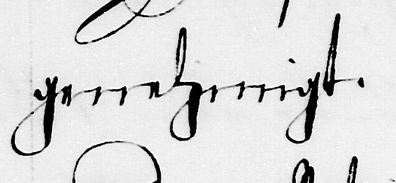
genehmigt.
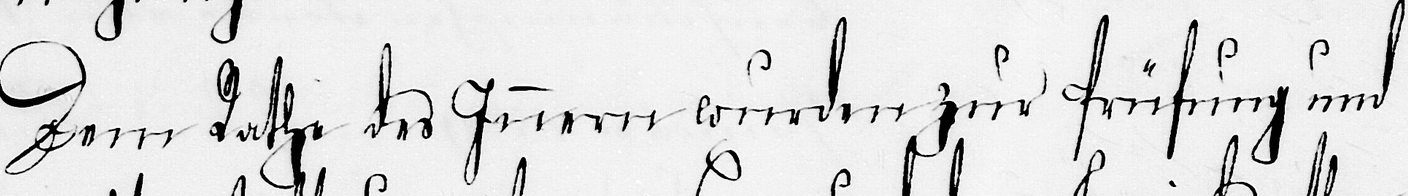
Dem Rathe des Innern wurden zur Prüfung und
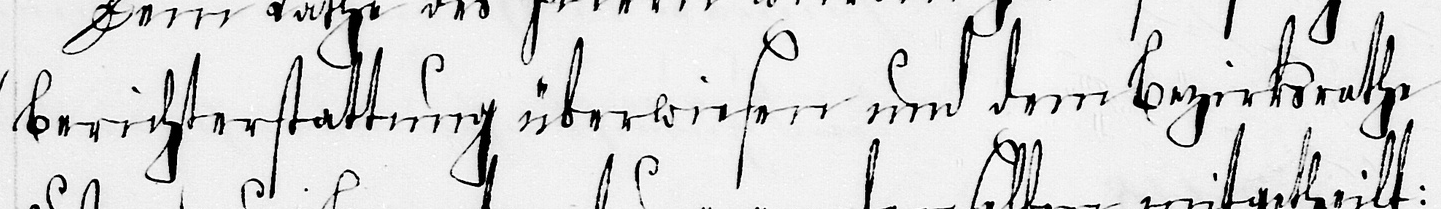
Berichterstattung überwiesen und dem Bezirksrathe
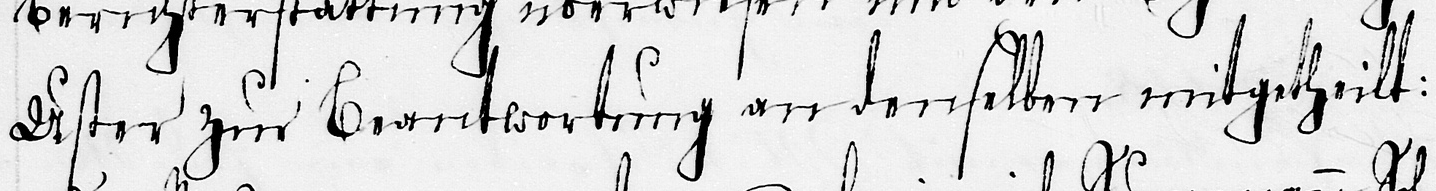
Uster zur Beantwortung an denselben mitgetheilt:
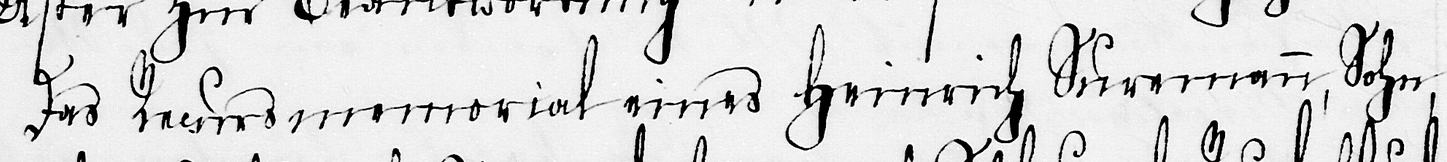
Das Recursmemorial eines Heinrich Suremann, Sohn,
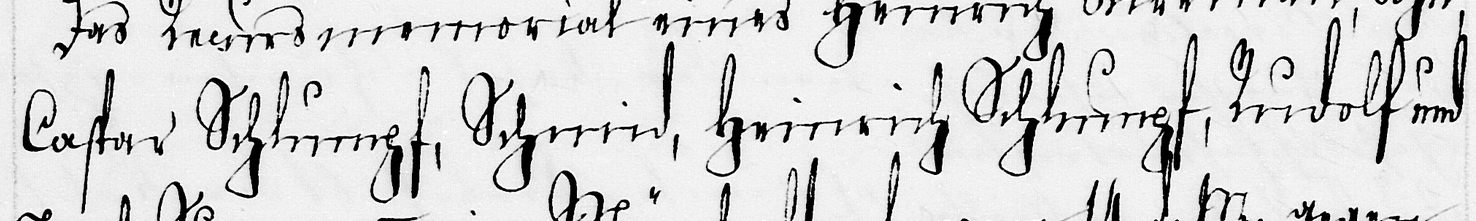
Caspar Schlumpf, Schmid, Heinrich Schlumpf, Rudolf und
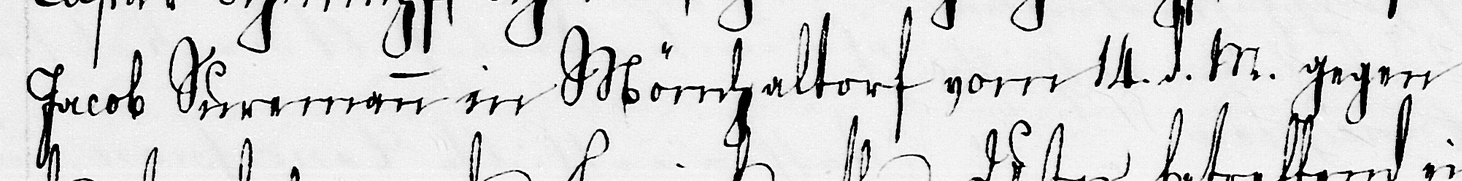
Jacob Suremann in Mönchaltorf vom 14. d. M. gegen
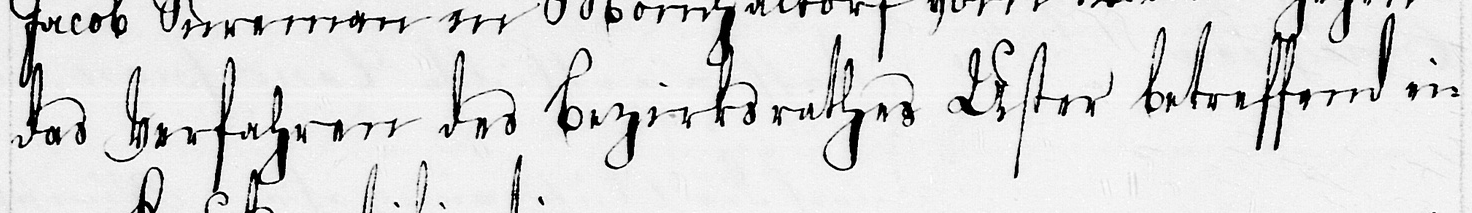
das Verfahren des Bezirksrathes Uster betreffend ei¬
